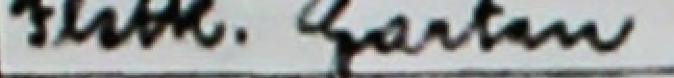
Flstk. Garten
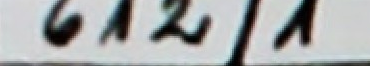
612/1
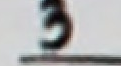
3
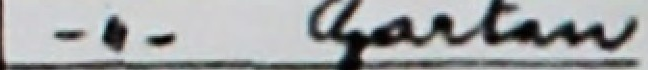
-„- Garten
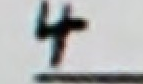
4
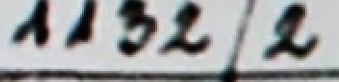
1132/2
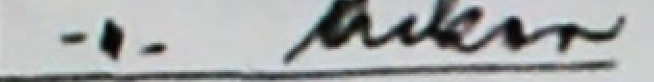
-„- Acker
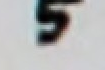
5
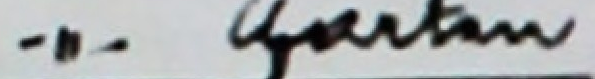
-„- Garten
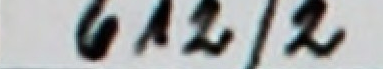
612/2
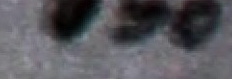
650
